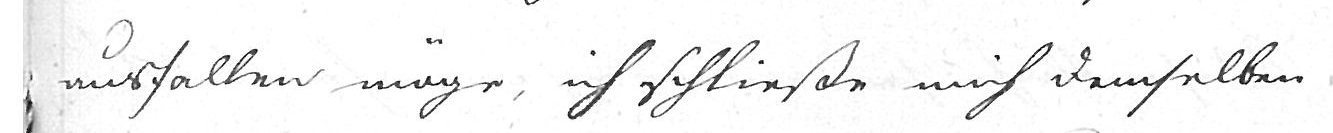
ausfallen möge, ich schließe mich demselben
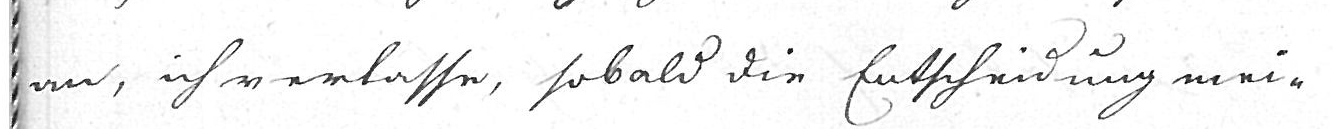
an, ich verlasse, sobald die Entscheidung mei-
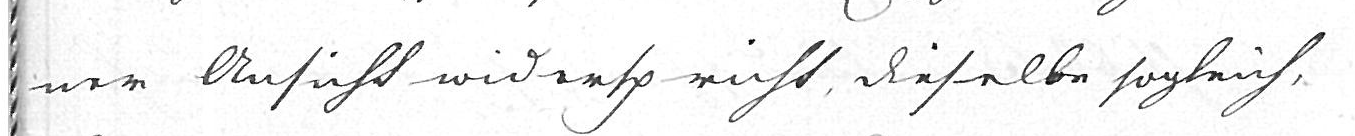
ner Ansicht widerspricht, dieselbe sogleich
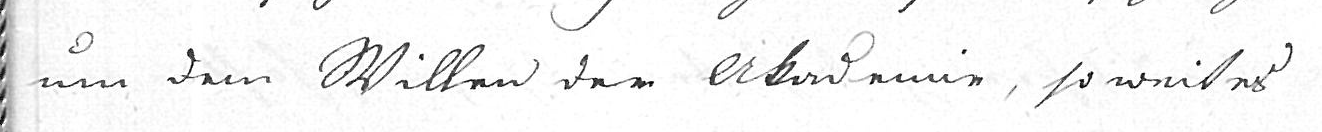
um dem Willen der Akademie, so weit es
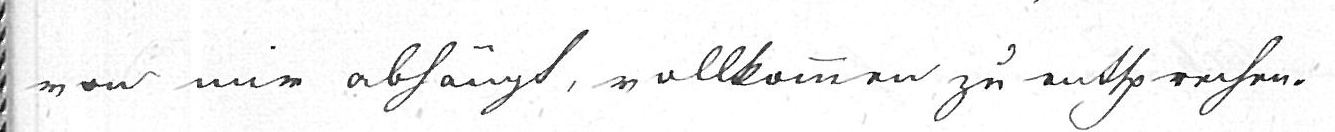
von mir abhängt, vollkommen zu entsprechen.
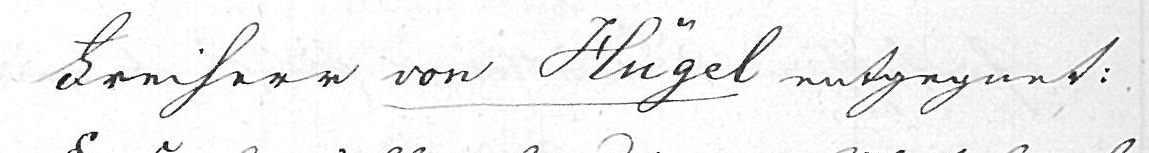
Freiherr von Hügel entgegnet:
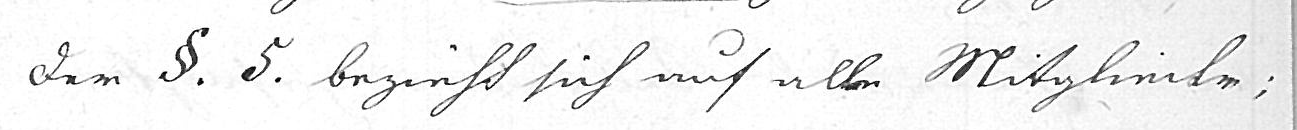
Der §. 5. bezieht sich auf alle Mitglieder,
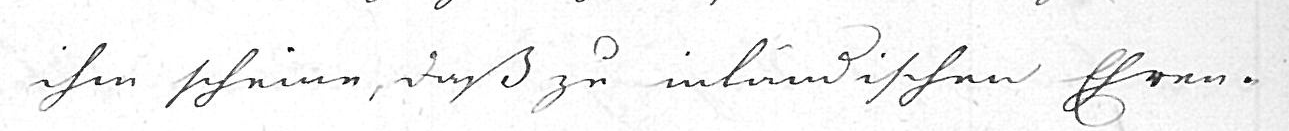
ihm scheine, daß zu inländischen Ehren-
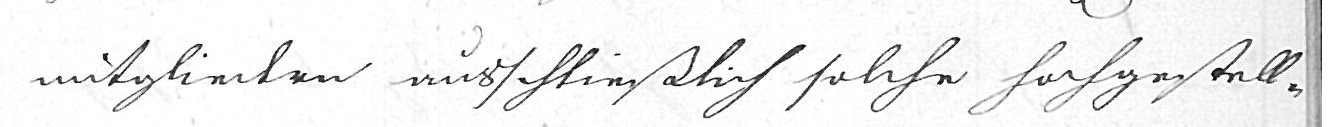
mitgliedern ausschließlich solche hochgestell-
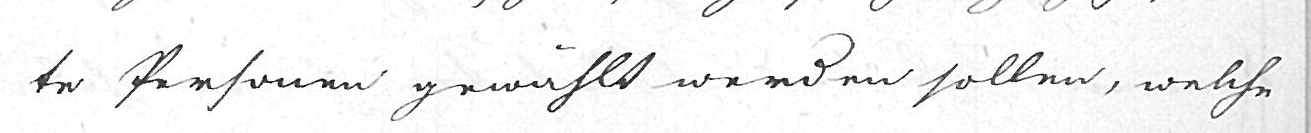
te Personen gewählt werden sollen, welche
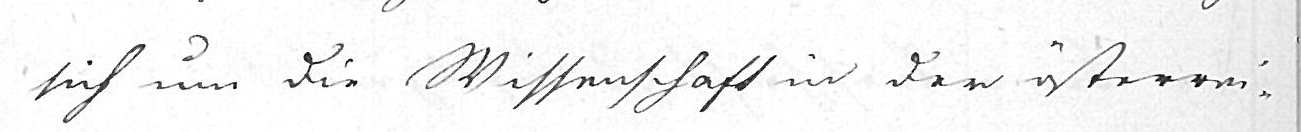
sich um die Wissenschafts in der österrei-
